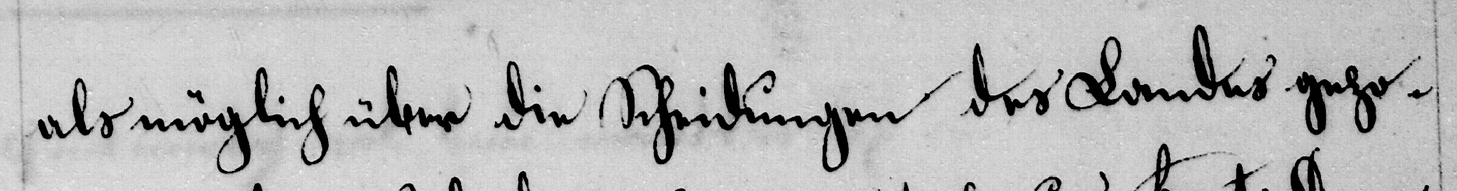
als möglich über die Scheidungen des Landes gezo¬
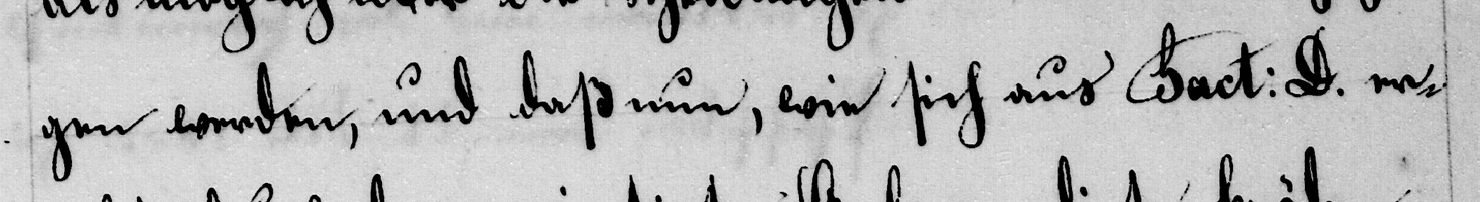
gen werden, und daß nun, wie sich aus Fact: D. er¬
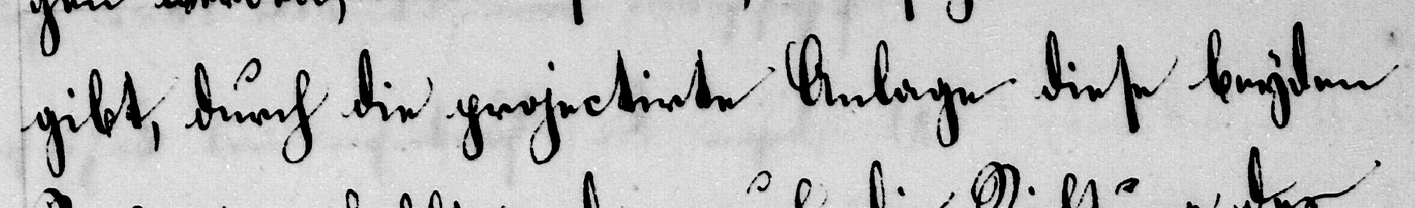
gibt, durch die projectirte Anlage diese beyden
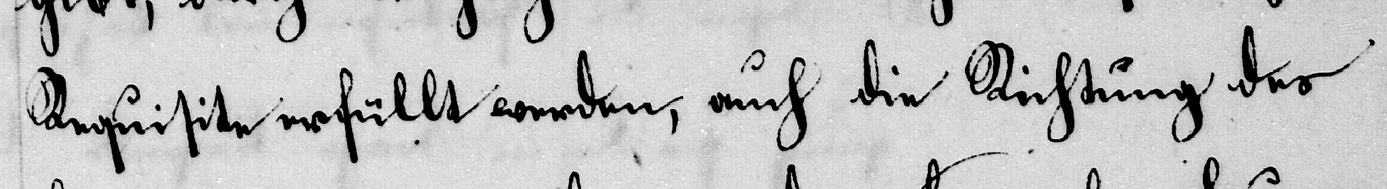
Requisite erfüllt werden, auch die Richtung des
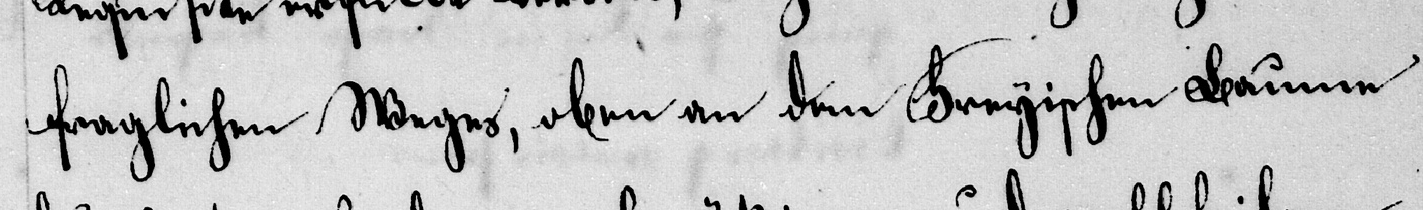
fraglichen Weges, oben an dem Freyischen Baume
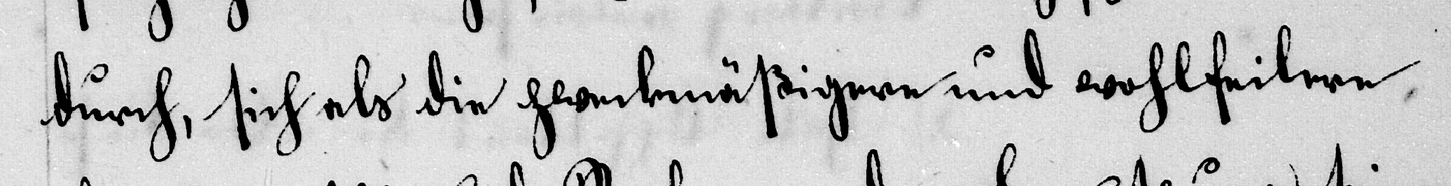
durch, sich als die zweckmäßigere und wohlfeilere
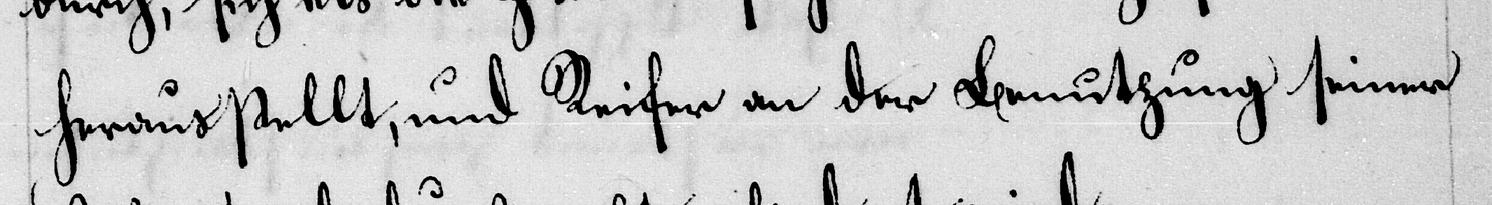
herausstellt, und Reifer an der Benutzung seiner
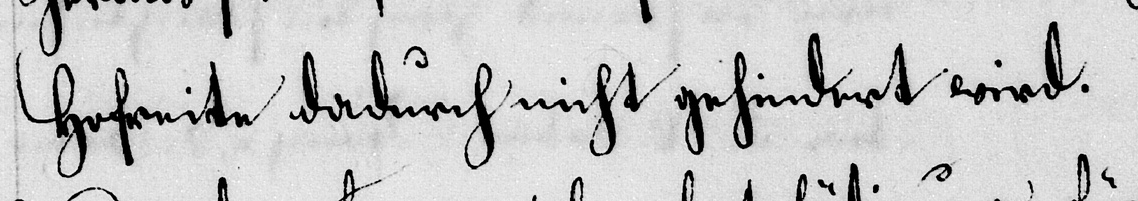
Hofreite dadurch nicht gehindert wird.
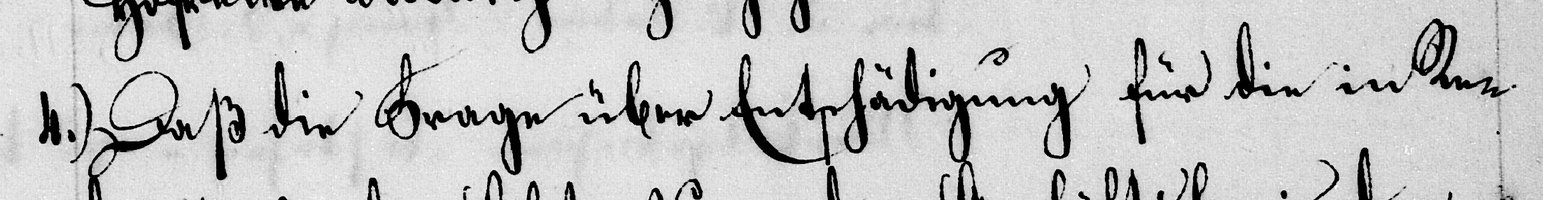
4.) Daß die Frage über Entschädigung für die in Re¬
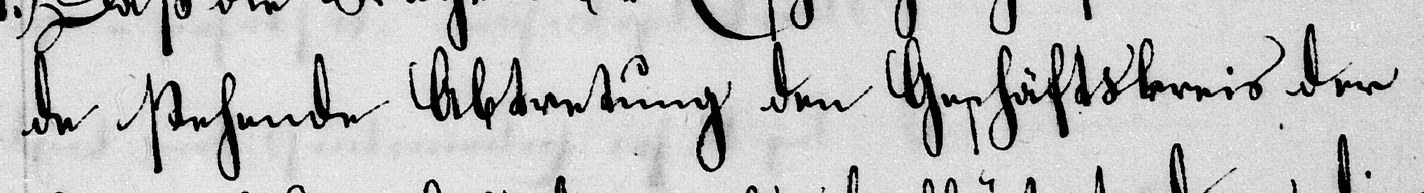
de stehende Abtretung den Geschäftskreis der
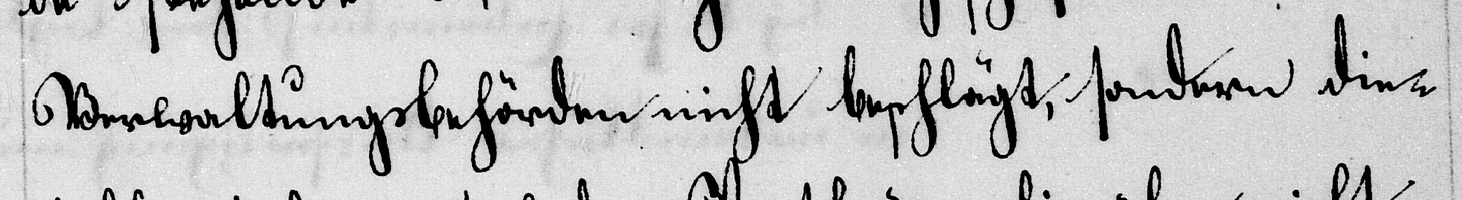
Verwaltungsbehörden nicht beschlägt, sondern die¬
